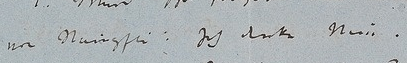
von Stämpfli: Ich denke Nein.
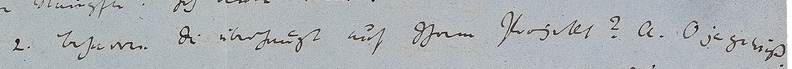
2. Beharren Sie überhaupt auf ihrem Projekt? A. O ja gewiß.
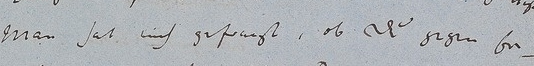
Man hat mich gefragt, ob Du gegen Er-
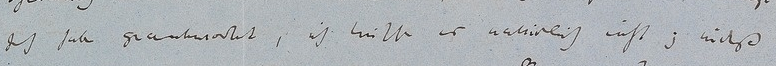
Ich habe geantwortet, ich wisse es natürlich nicht; indeß
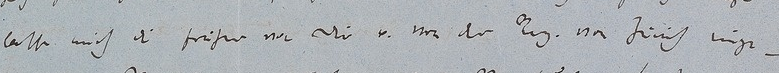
lasse mich die früher von Dir &. von der Reg. von Zürich einge-
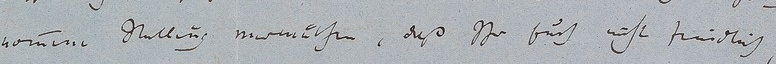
nommene Stellung vermuthen, daß Ihr Euch nicht feindlich,
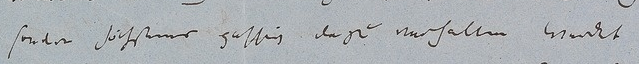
sondern höchstens passiv dazu verhalten werdet.
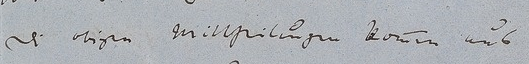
Die obigen Mittheilungen kommen aus
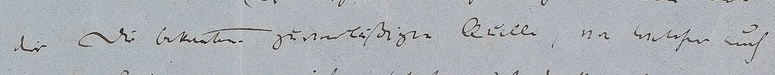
der Dir bekannten zuverläßigen Quelle, von welcher auch
